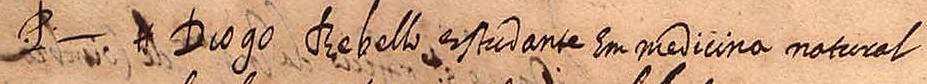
P – item Diogo Rebello Estudante Em medicina natural
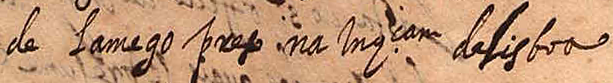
de Lamego preso na Inq.cam de Lisboa
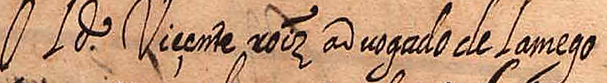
O Ldo Vicente roīz aduogado de Lamego
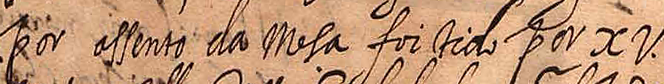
por assento da Mesa foi tido por XV.
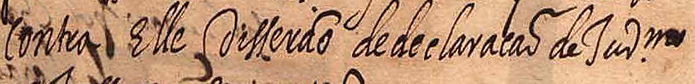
contra Elle disserão de declaracaõ de Iud.mo
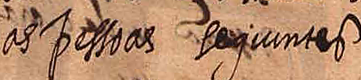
as pessoas seguintes
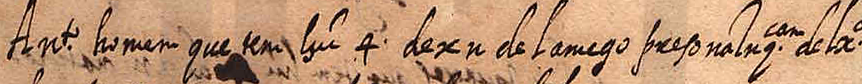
item Anto homem que tem hū 4 de xn de Lamego preso na Inq.cam de lx.a
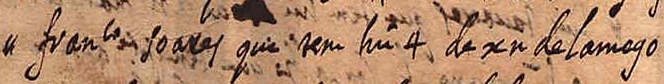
item franco soares que tem hū 4 de xn de lamego
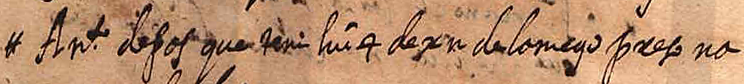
item Anto de pas que tem hū 4 de xn de lamego preso na
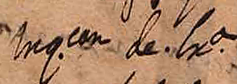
Inq.cam de lx.a
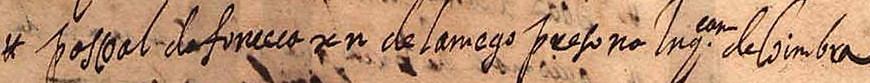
item pascoal da fonceca xn de Lamego preso na Inq.cam de Coimbra
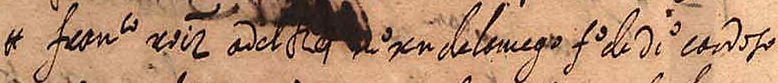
item franco roīz o del Rej mo xn de lamego fo de dio cardoso
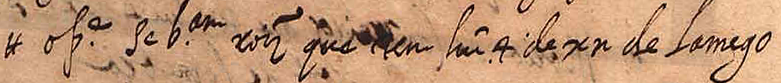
item o p.e seb.am roīz que tem hū 4 de xn de Lamego
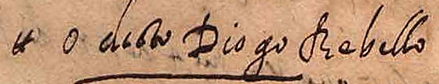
item o dicto Diogo Rebello
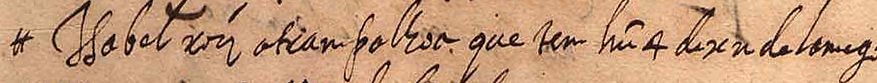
item Isabel roīz a trampalhoa que tem hū 4 de xn de Lamego
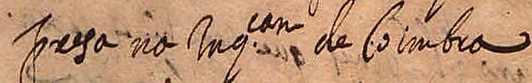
presa na Inq.cam de Coimbra
